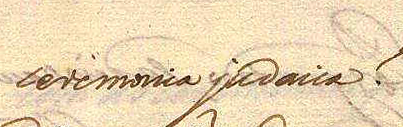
ceremonia judaica?
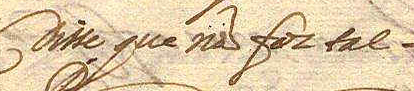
Disse que naõ fez tal
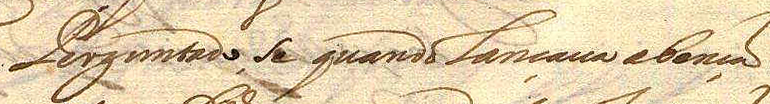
Perguntado, se quando Lançaua a bençaõ
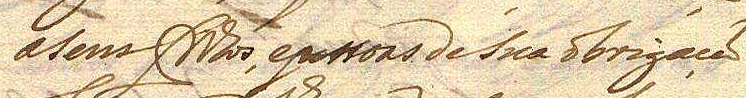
a seus filhos, e pessoas de sua obrigaçaõ
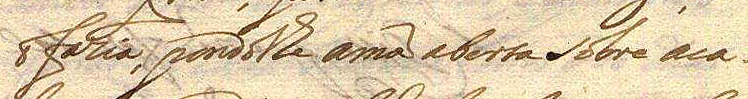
o fazia, pondolhe a maõ aberta sobre a ca
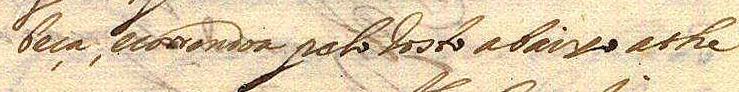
beça, e correndoa pelo Rosto abaixo athe
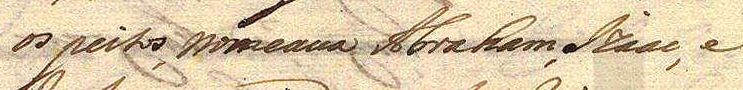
os peitos, nomeaua Abraham, Izaac, e
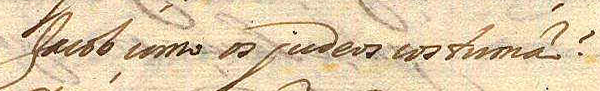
Jacob, como os judeos costumaõ?
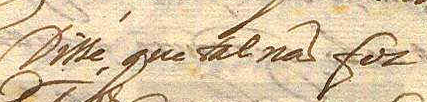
Disse, que tal naõ fez
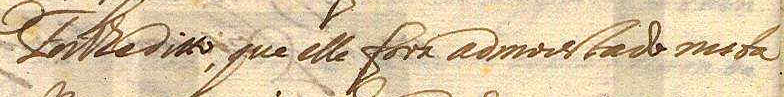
Foilhe ditto, que elle fora admoestado nesta
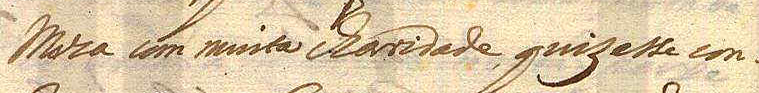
Meza com muita charidade, quizesse con
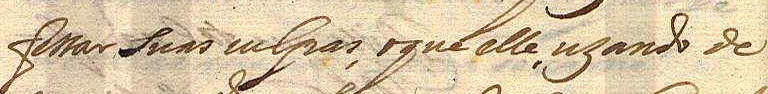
fessar suas culpas, o que elle uzando de
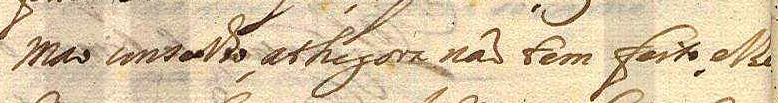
mao conselho, athe gora naõ tem feito, e lhe
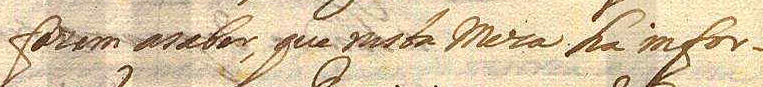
fazem a saber, que nesta Meza há infor
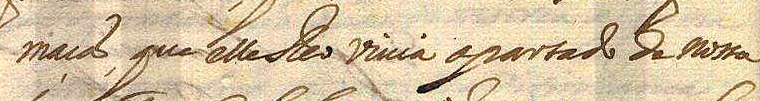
maçaõ que elle Reo viuia apartado de nossa
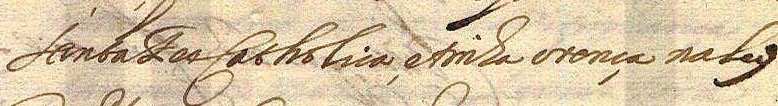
Santa Fee Catholica, e tinha crença na Ley
